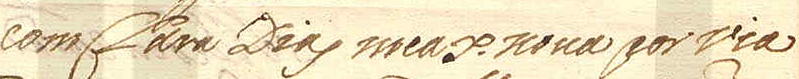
com Clara Dias mea x. noua por Via
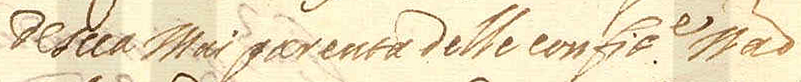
de sua Mai parenta delle confit.e Naõ
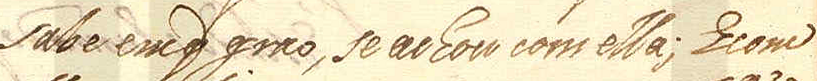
sabe em q̄ grao, se achou com ella; E com
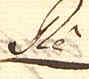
Rê
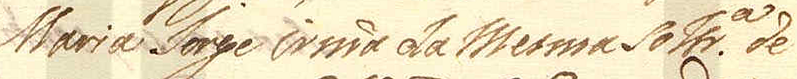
Maria Iorge irmã da Mesma soltr.a de
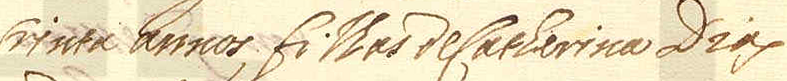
trinta annos, filhas de Catherina Dias
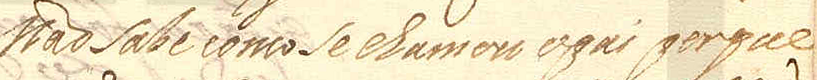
Naõ sabe como se chamou o pai porque
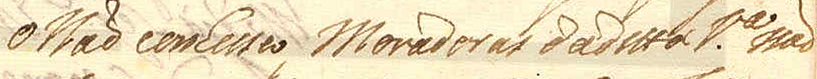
o Naõ conhesseo, Moradoras da ditta V.a naõ
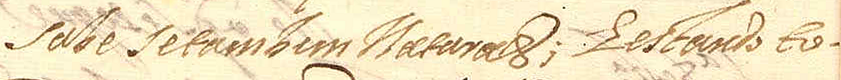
sabe se também Naturaes; E estando to
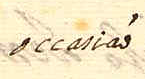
occasiaõ
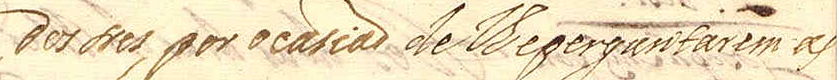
dos tres, por ocasiaõ de lhe perguntarem as
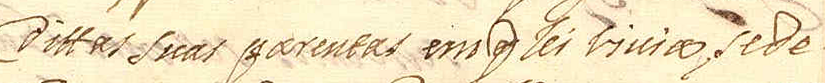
dittas suas parentas em q̄ lei viuia, se de
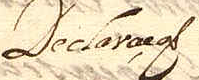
Declaração
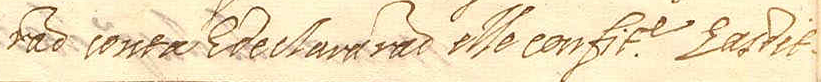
rão conta E declararão elle confit.e E as dit
